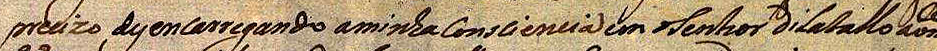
precizo desencarregando a minha Consciencia com o Senhor diLatallo a vmCe,
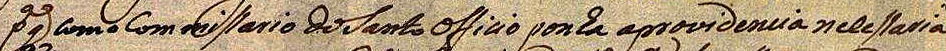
pa q̄ como commissario do Santo officio ponha a providencia necessaria
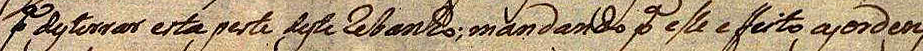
pa desterrar esta peste deste Rebanho; mandando pa esse effeito as ordens
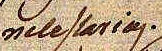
necessarias.
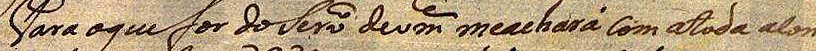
Para o que for do Servco de vmCe meachará com a toda acon
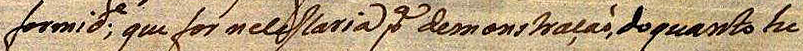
formide; que for necessaria pa demonstraçaõ, do quanto he
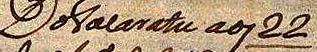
Do Tacaratu aos 22
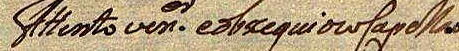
Attento ven.or e obxequiozo Capellaõ
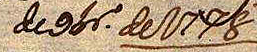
de 9br.o de 1778
